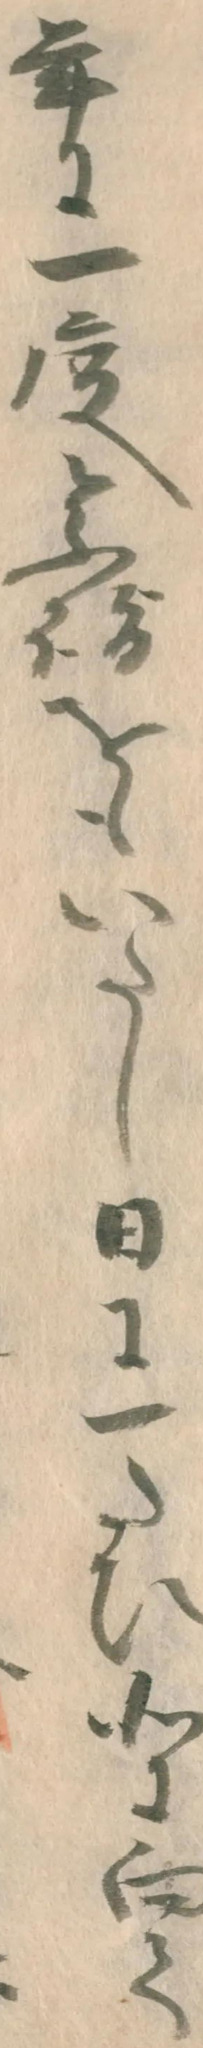年に一度参詣をもいたし日に一たひ北に向て
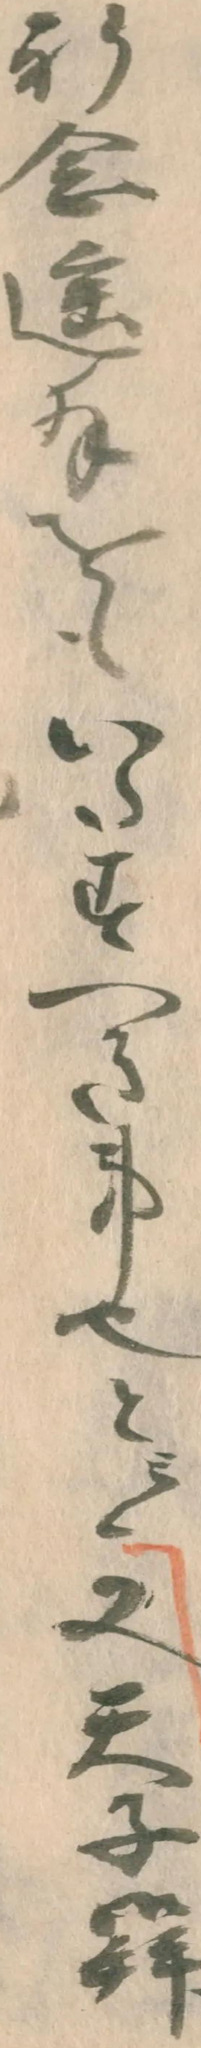祈念遥拝をもいたすへき事也と云々又天子御拝
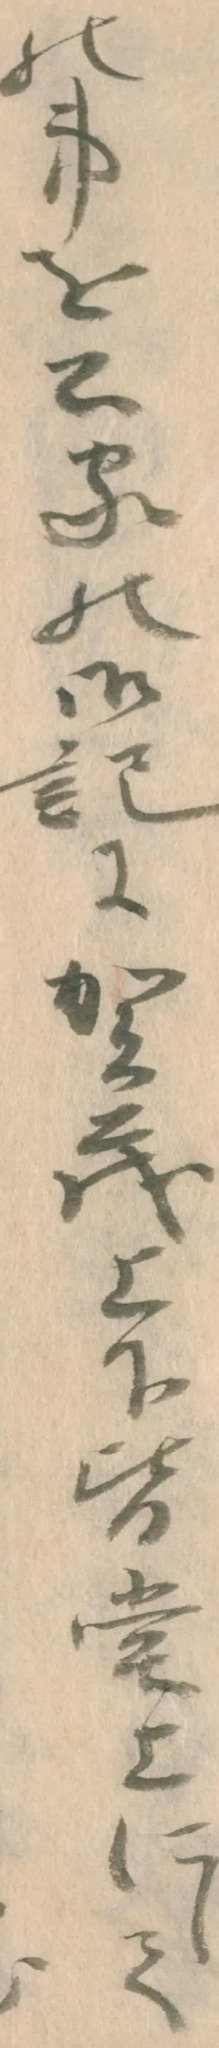の事を公家の御記に賀茂上下皆堂上にして
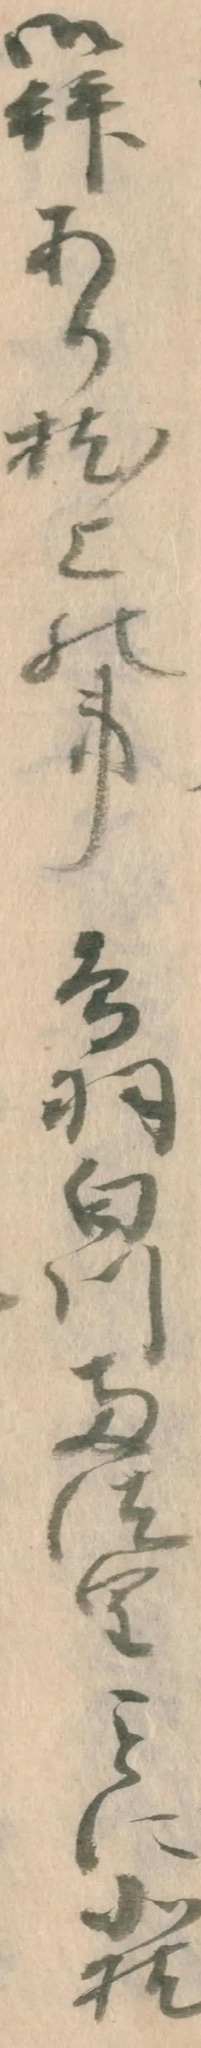御拝あり枕上の事鳥羽白川両法皇ことに北枕
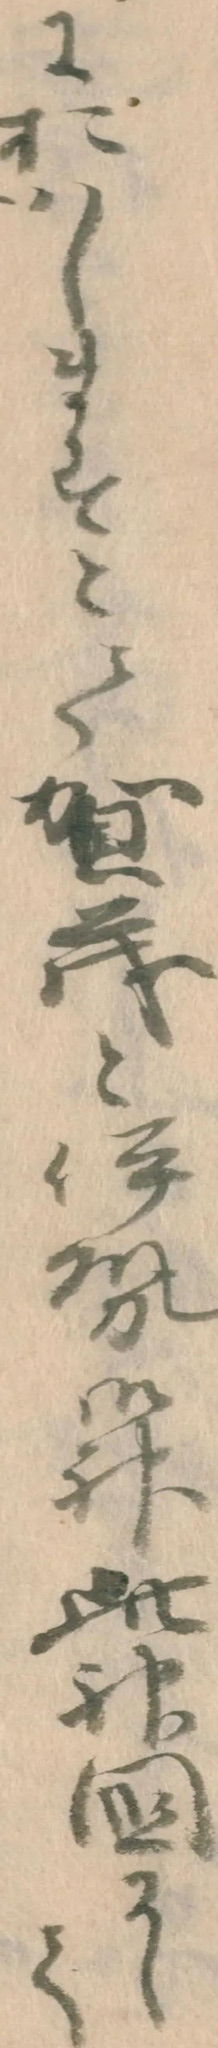におはしますと云々賀茂と伊勢御神此神国にして
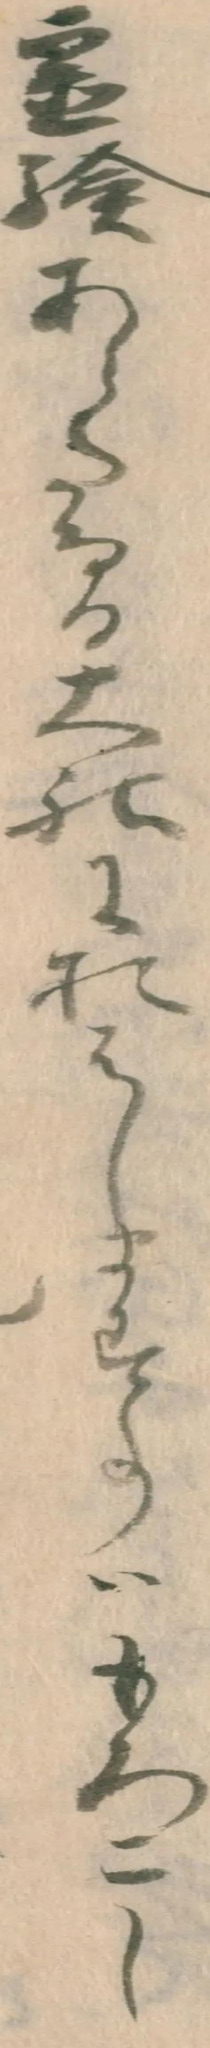霊験あらたなる大社におはします事はもろこし
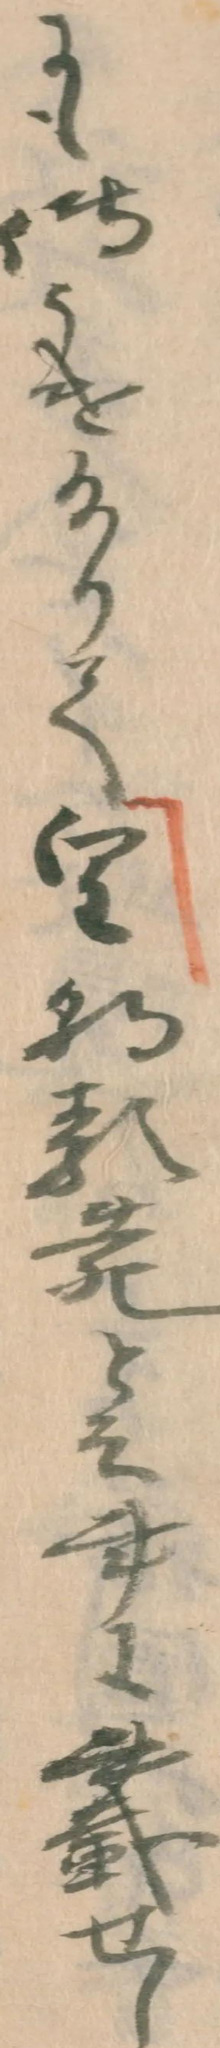にも伝うけ給りて皇朝類苑と云書に書載せし
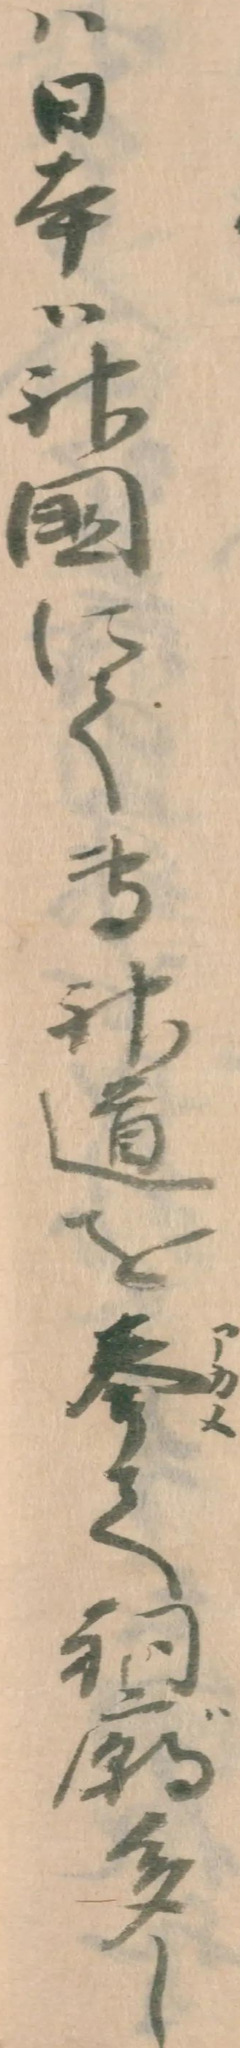は日本は神国にて専神道を奉て祠-廟多し
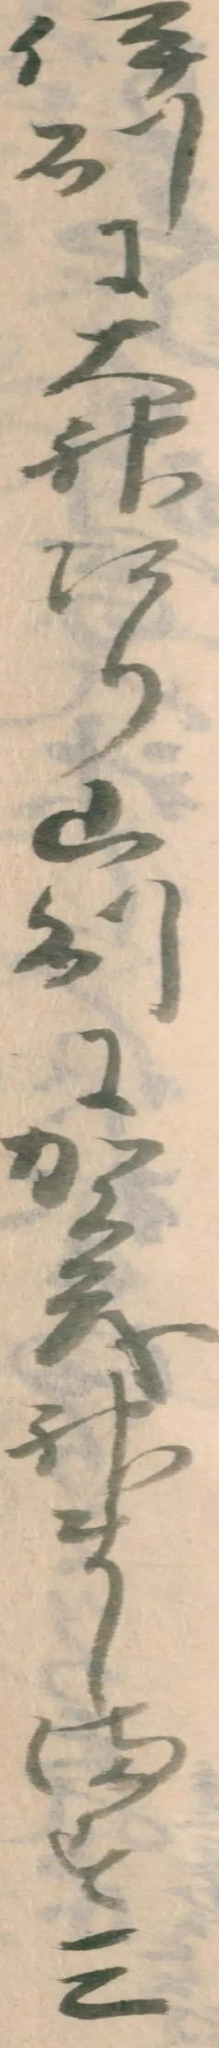伊州に大神あり山州に賀茂神まします三
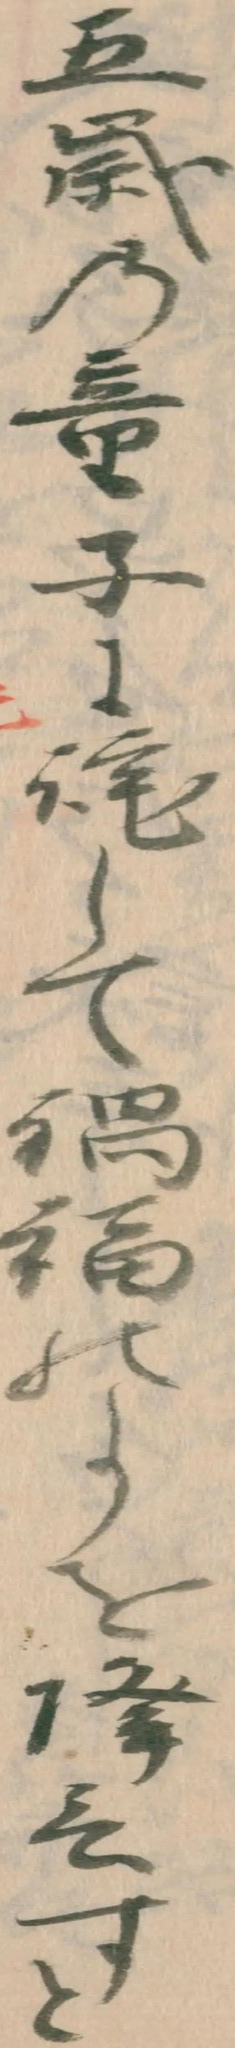五歳の童子に詫して禍福の事を降言すと
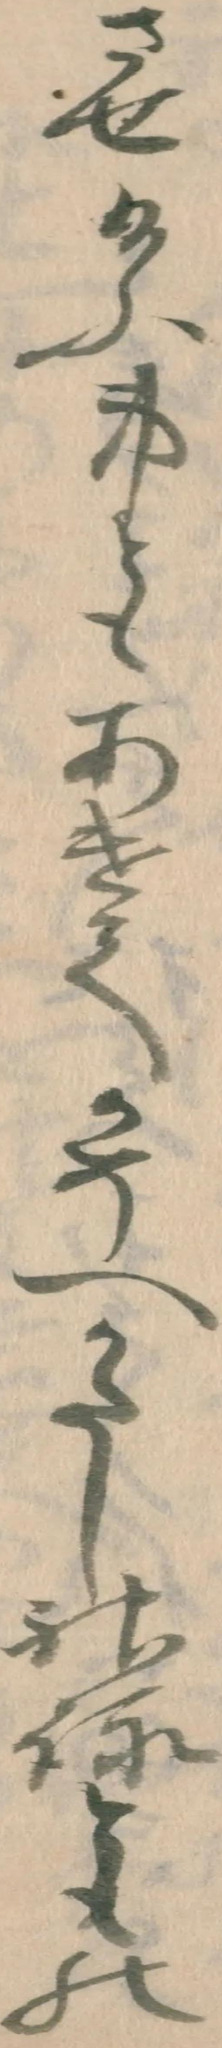させ給ふ事ともあけてかそへかたし神詠ともの
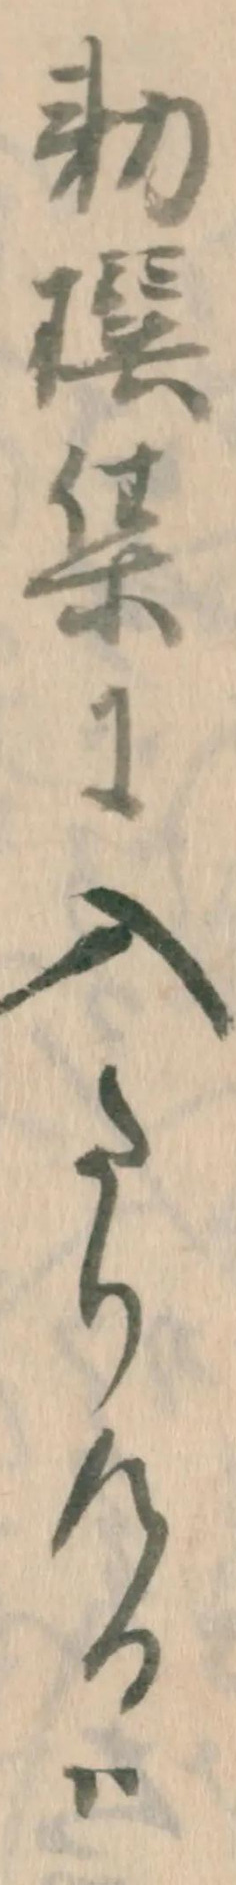勅撰集に入たりけるは
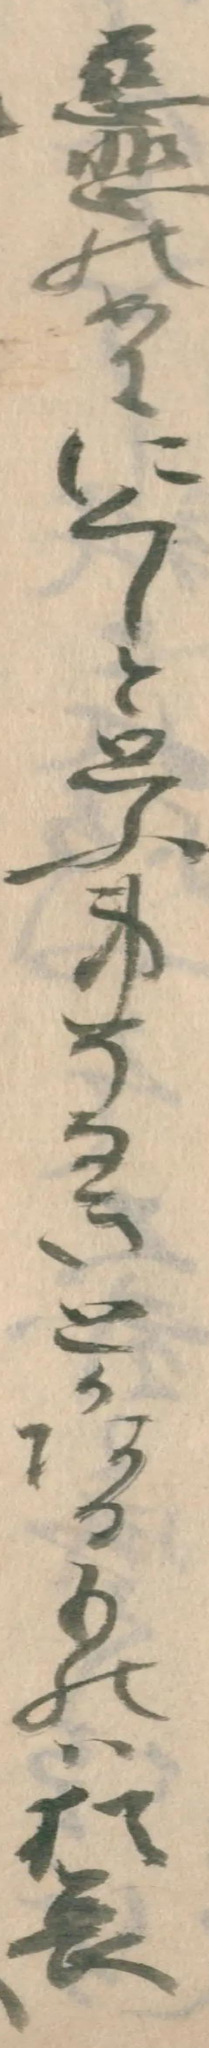慈悲のめににくしと思ふ事そなきとかあるものは猶哀にて
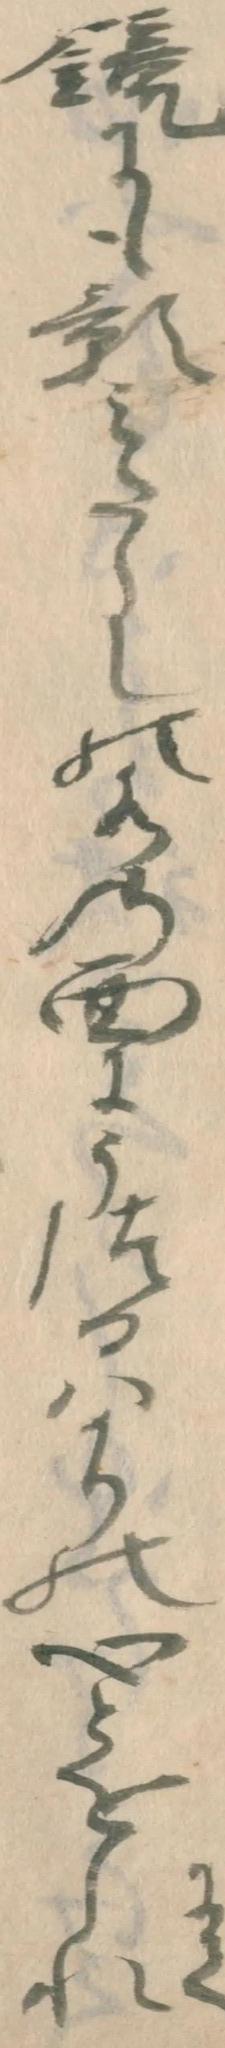鏡にも影みたらしの水の面にうつるはかりの心とをしれ
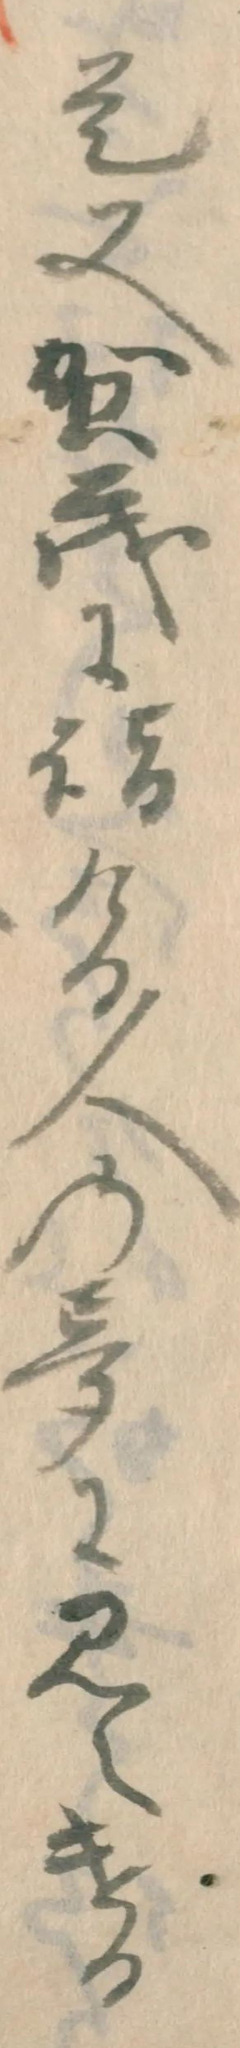是又賀茂に詣ける人の夢に見えける
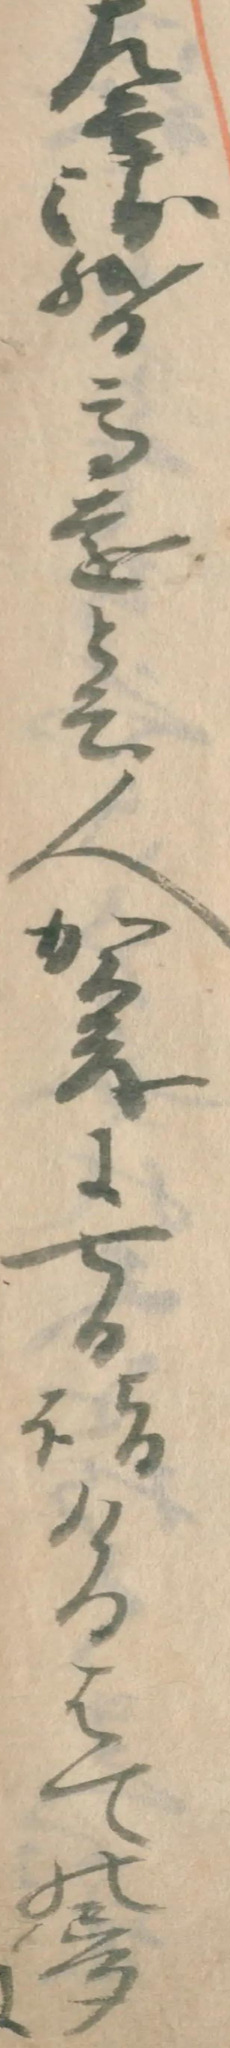左兵衛督高遠と云人賀茂に七日詣けるはての夢に
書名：賀茂社記録. 第1冊
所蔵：国立国会図書館 National Diet Library, JAPAN
